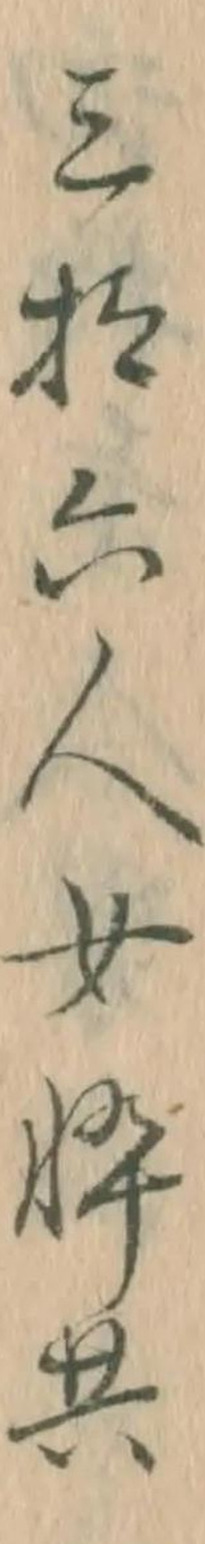三拾六人女忰共

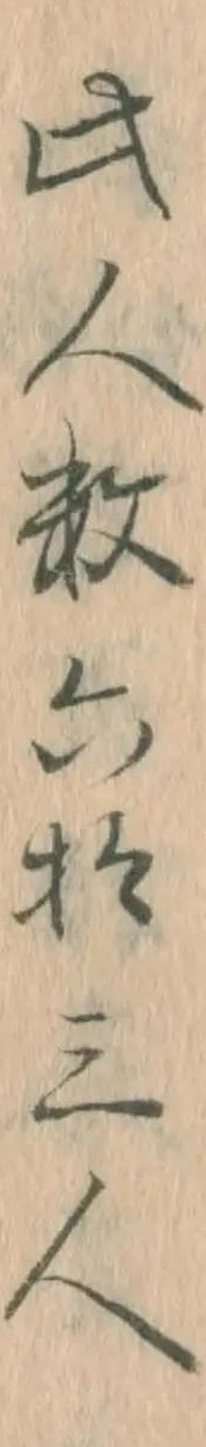此人数六拾三人
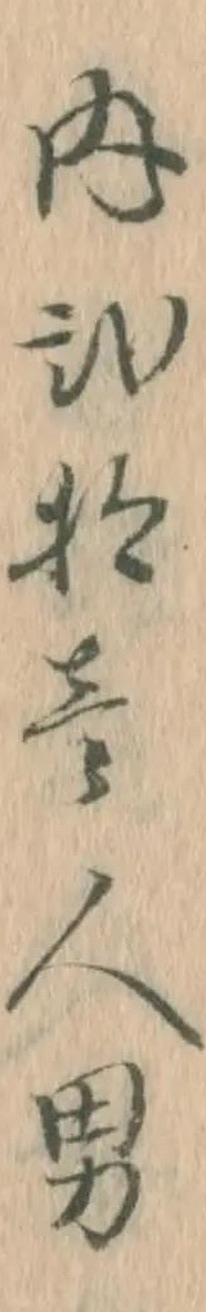内弐拾壱人男
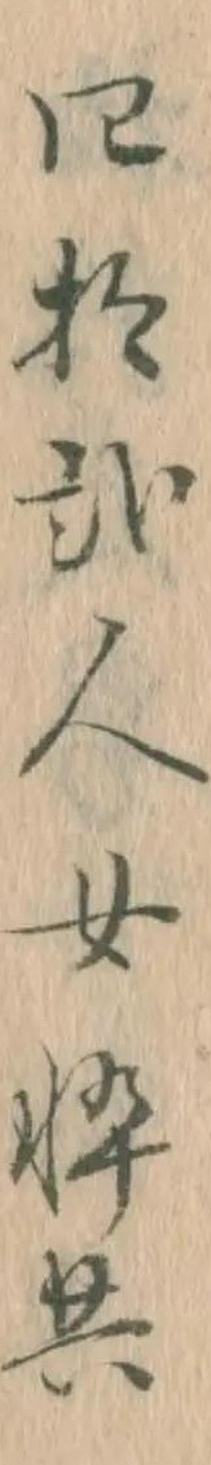四拾弐人女忰共
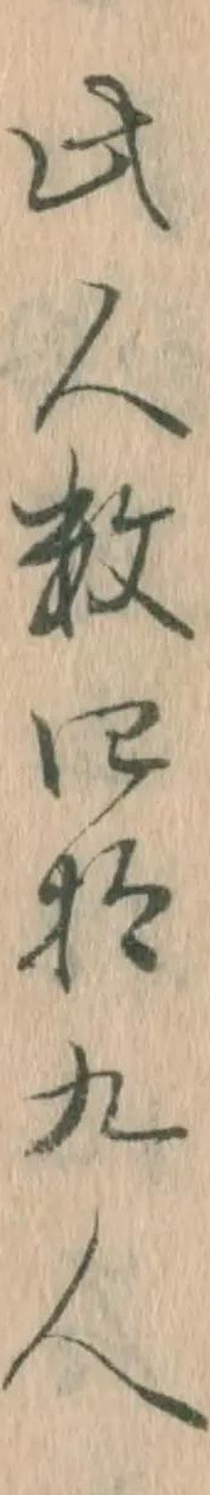此人数四拾九人男
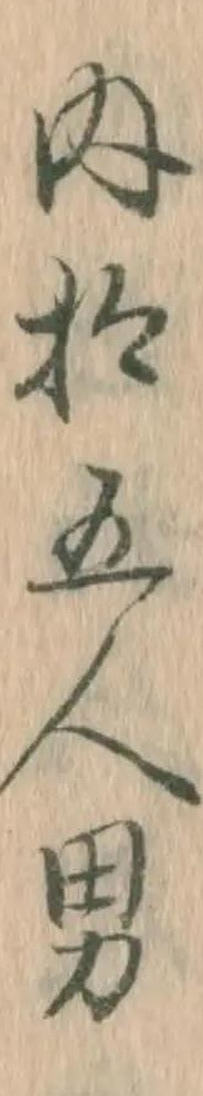内拾五人男
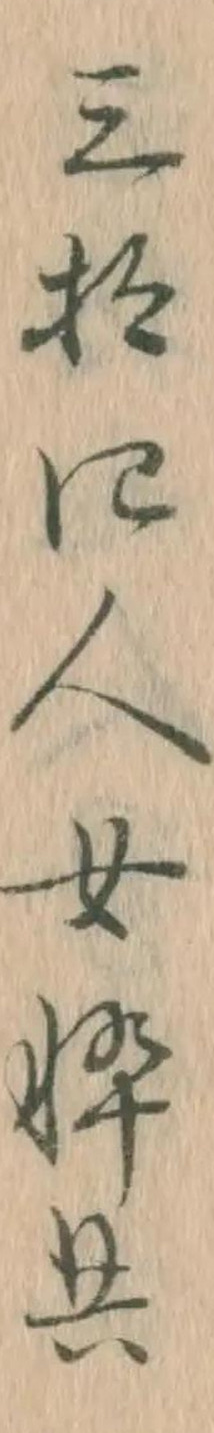三拾四人女忰共
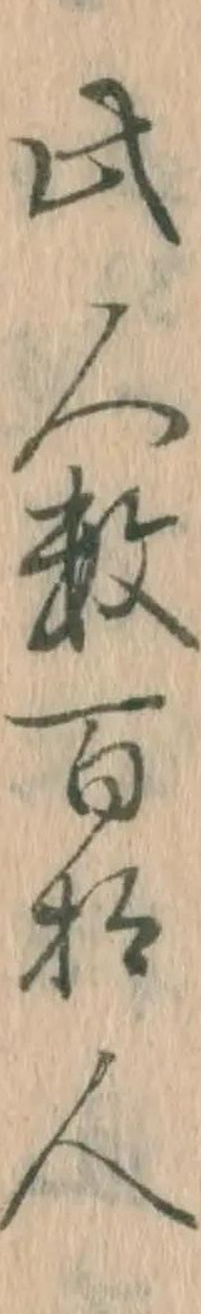此人数百拾人
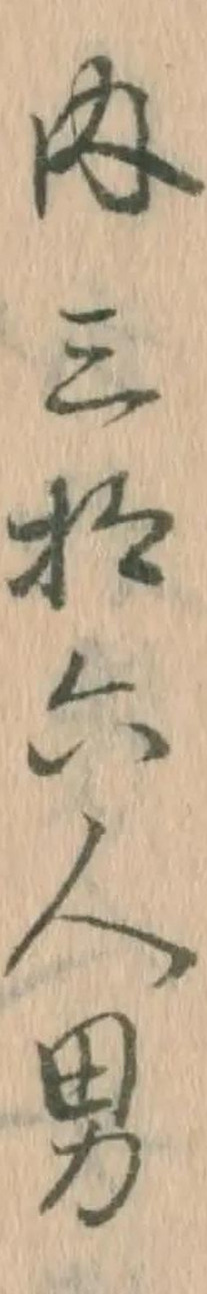内三拾六人男
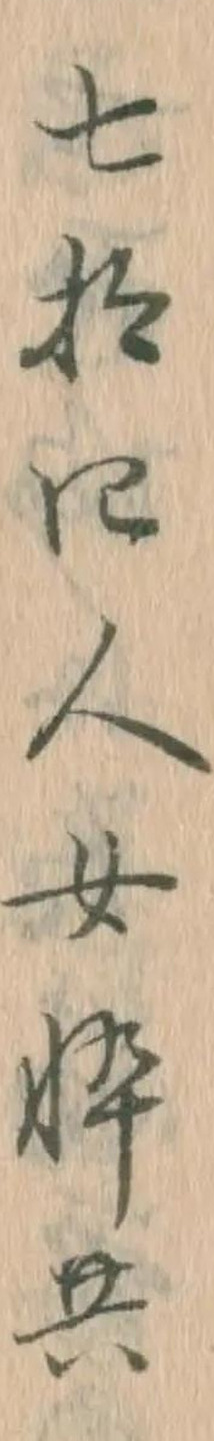七拾四人女忰共
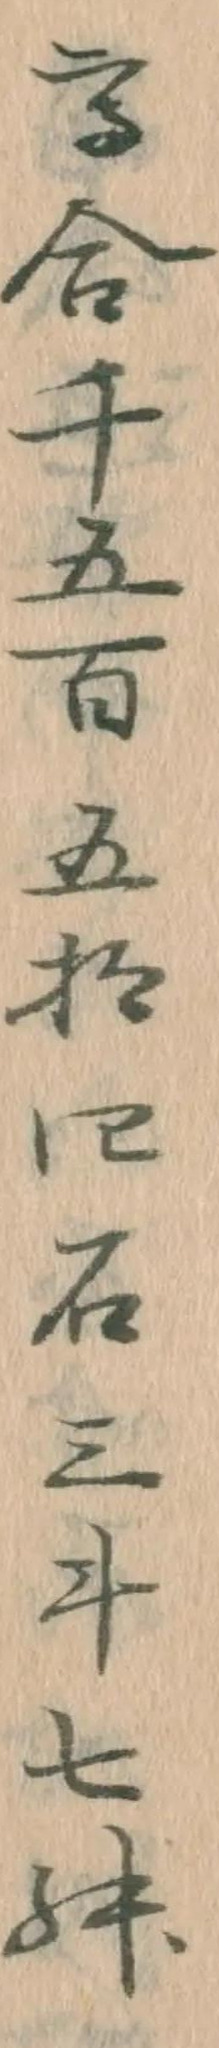高合千五百五拾四石三斗七升
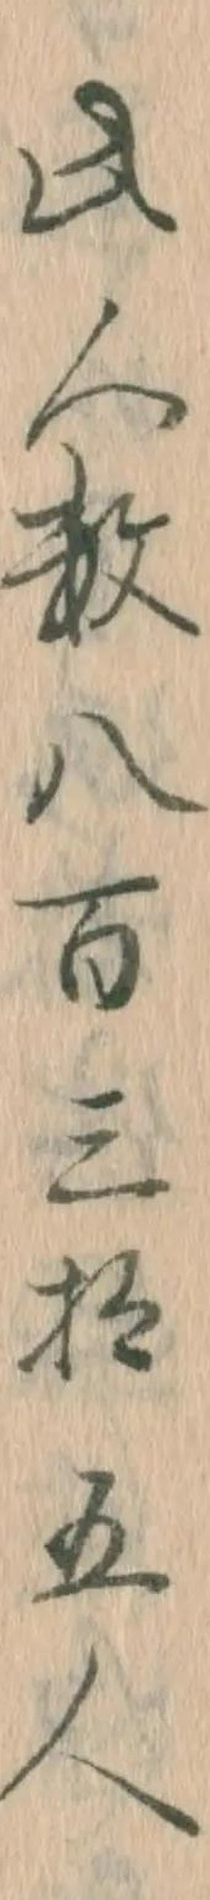此人数八百三拾五人
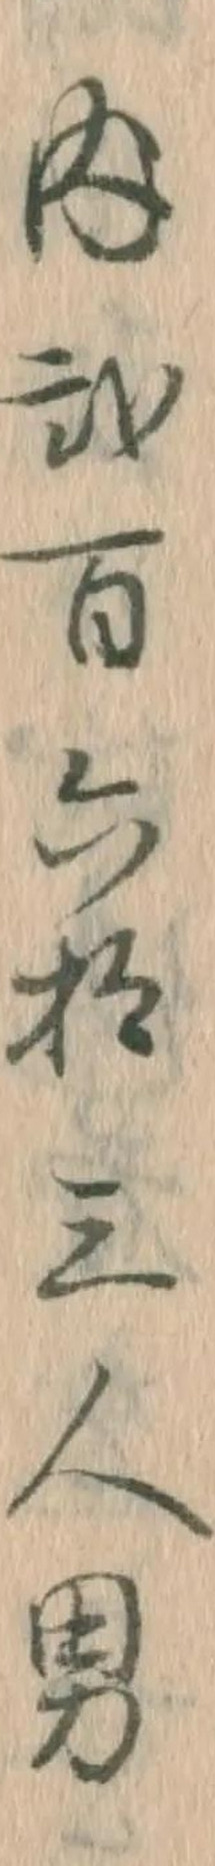内弐百六拾三人男
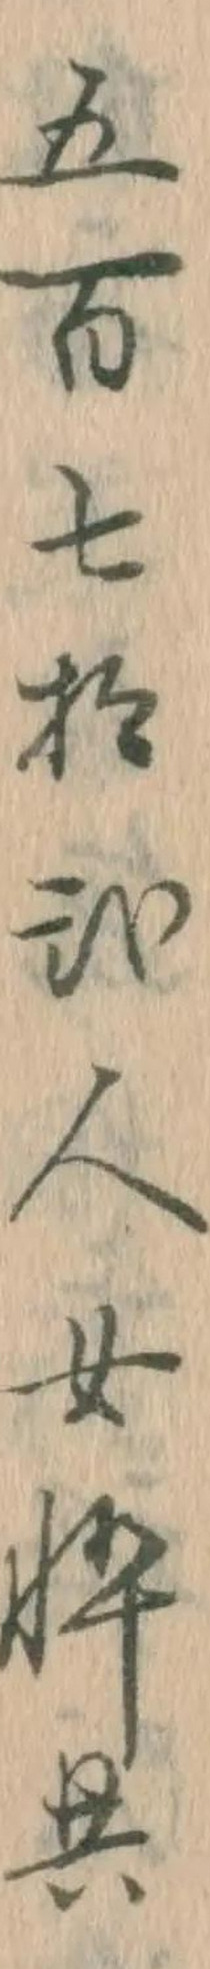五百七拾弐人女忰共
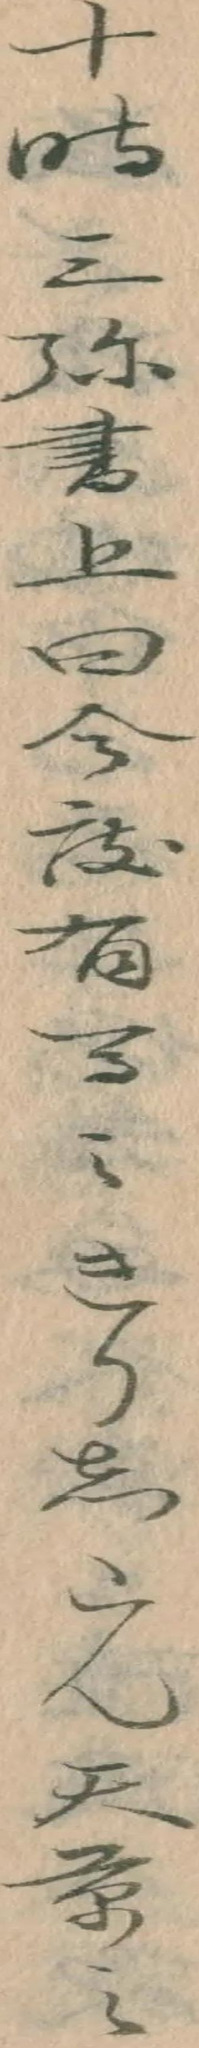十時三弥書上曰今度有馬之きり志たん天草之
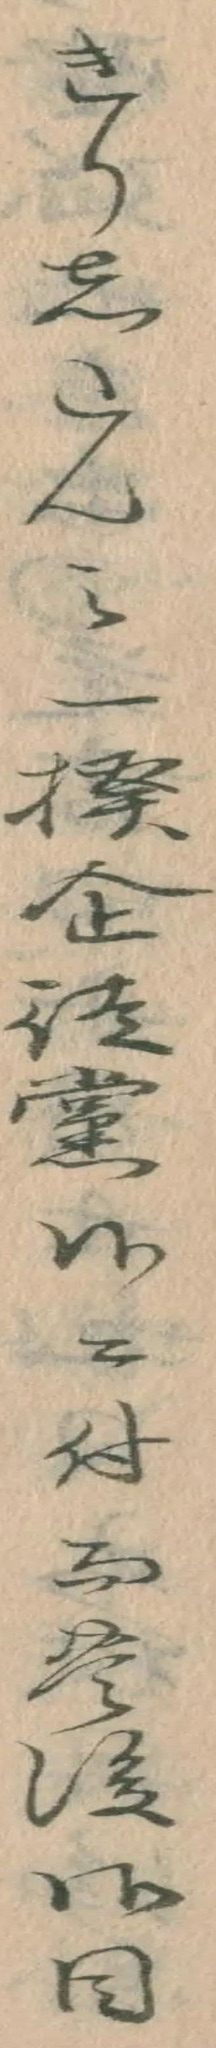きり志たん之一揆企徒党候に付而豊後御目
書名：切支丹御退治記 49巻. [2]
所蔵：国立国会図書館 National Diet Library, JAPAN
